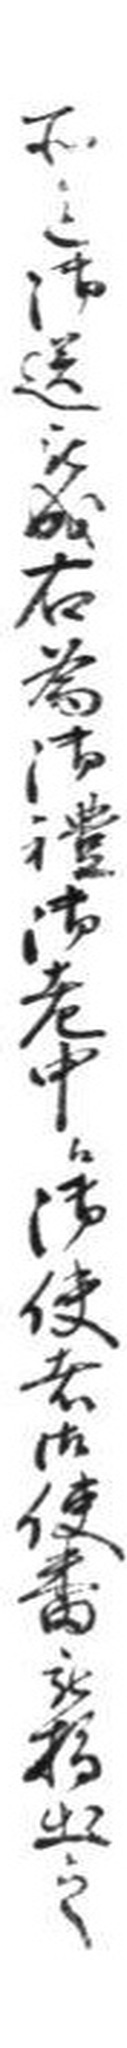所迄御送被成右為御礼御老中江御使者御使番被指出之
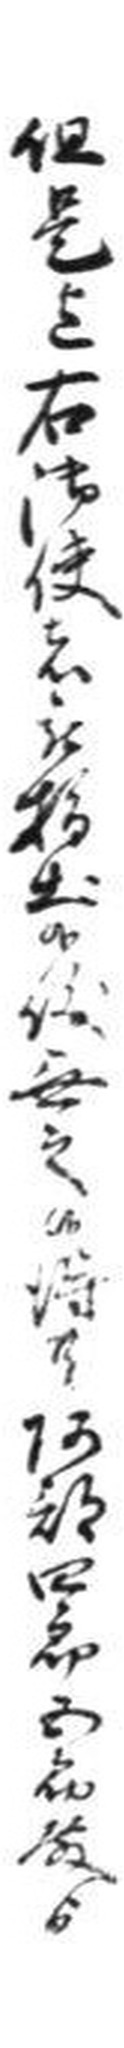但是迄右御使者被指出候儀無之候得共阿部四郎五郎殿ゟ
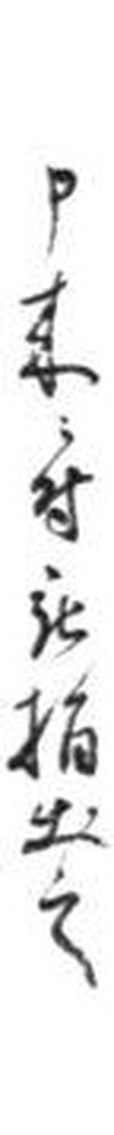申来ニ付被指出之
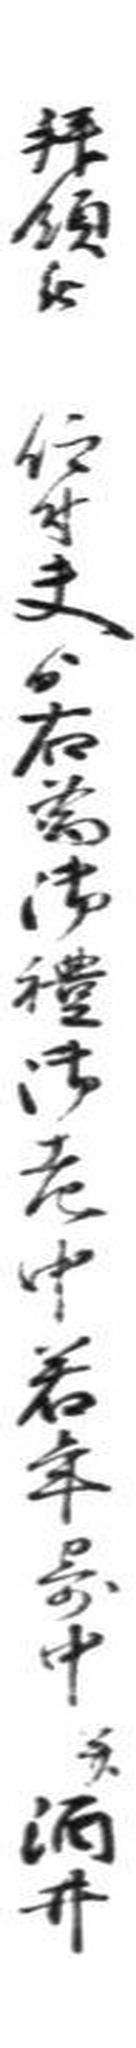拝領被仰付夫ゟ右為御礼御老中若年寄中并酒井
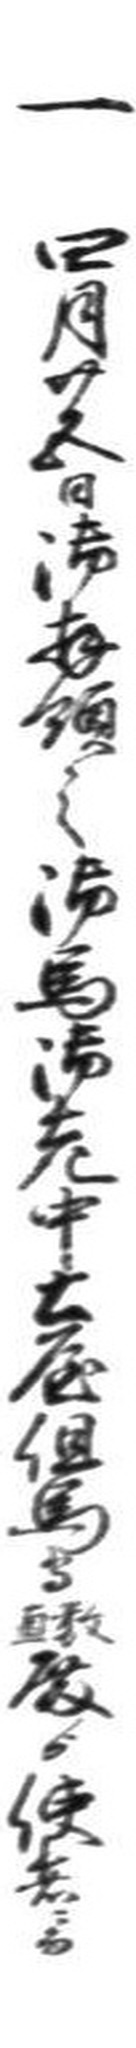一四月廿五日御拝領之御馬御老中土屋但馬守数直殿ゟ使者ニ而
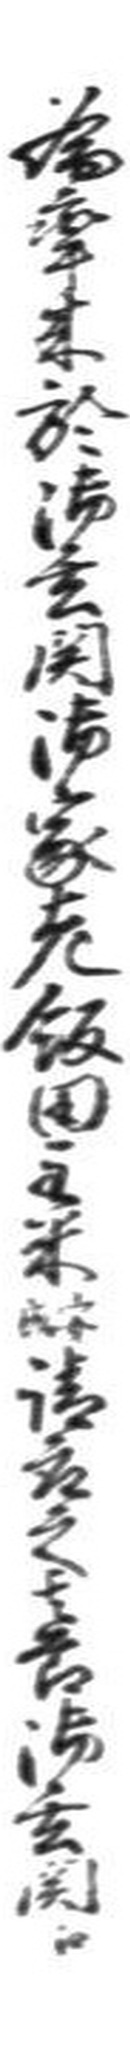為率来於御玄関御家老飯田主米安成請取之其節御玄関江
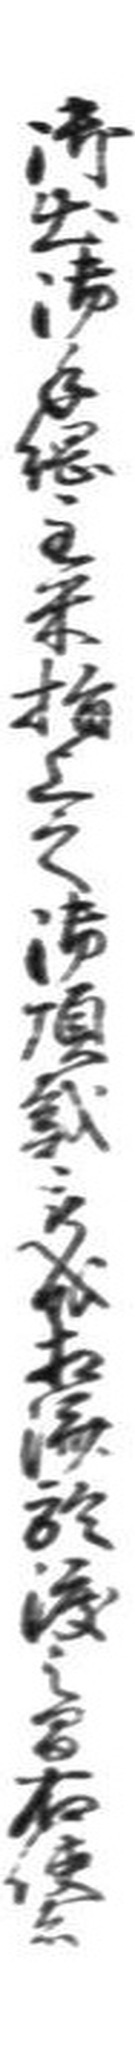御出御手綱主米指上之御頂戴被成相済於渡之間右使者
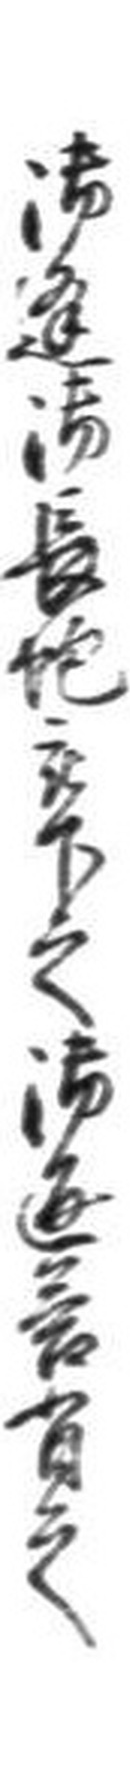御逢御長蚫被下之御返答有之
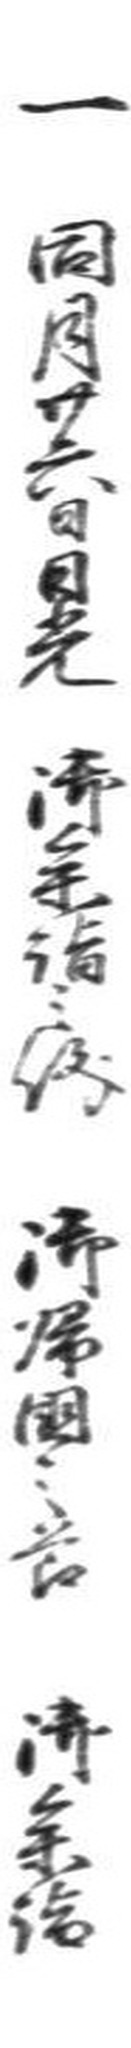一同月廿六日日光御参詣之儀御帰国之節御参詣
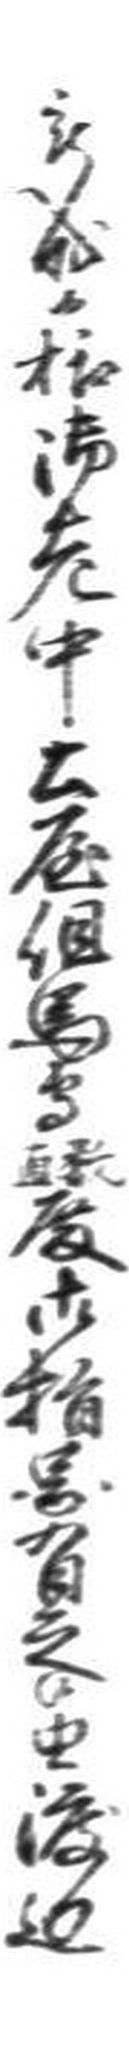被成候様御老中土屋但馬守数直殿御指図有之候由渡辺
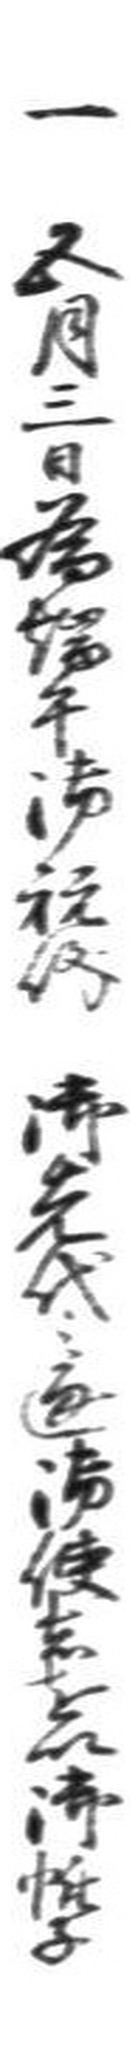一五月三日為端午御祝儀御先代之通御使者を以御帷子

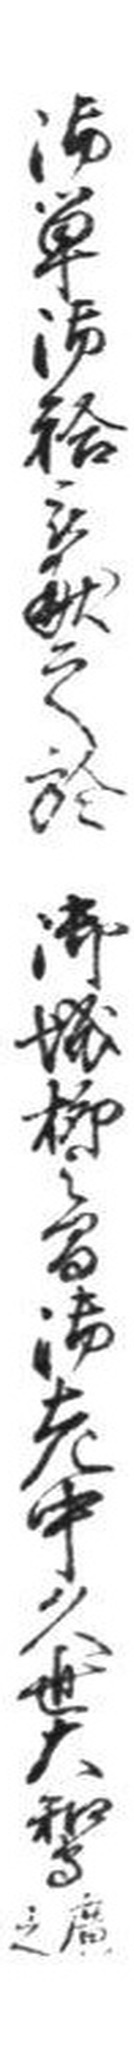御単御袷被献之於御城柳之間御老中久世大和守広之
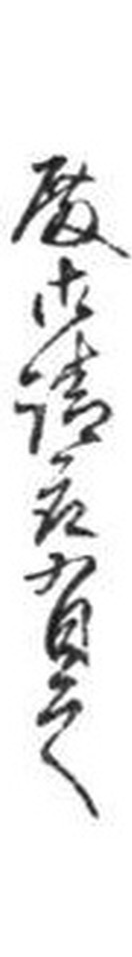殿御請取有之
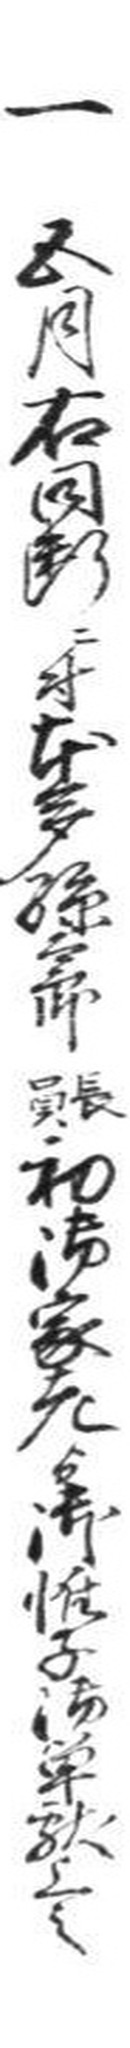一五月右同断ニ付本多孫太郎長員初御家老ゟ御帷子御単献上之
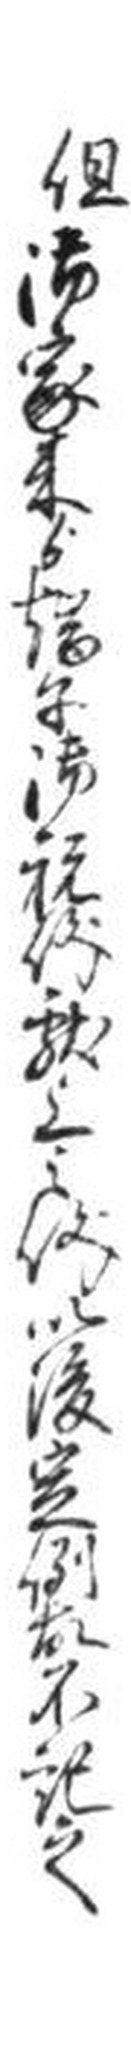但御家来ゟ端午御祝儀献上之儀以後定例故不記之
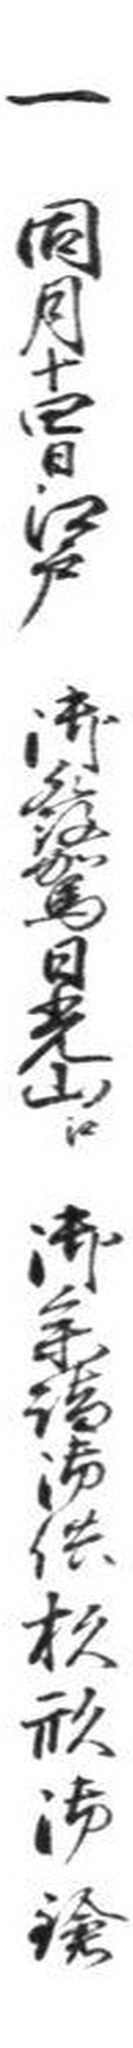一同月十四日江戸御発駕日光山江御参詣御供杉形御槍
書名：家譜 十三 綱昌公 従寛文元年到延宝五年
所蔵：福井県文書館 Fukui Prefectural Archives
